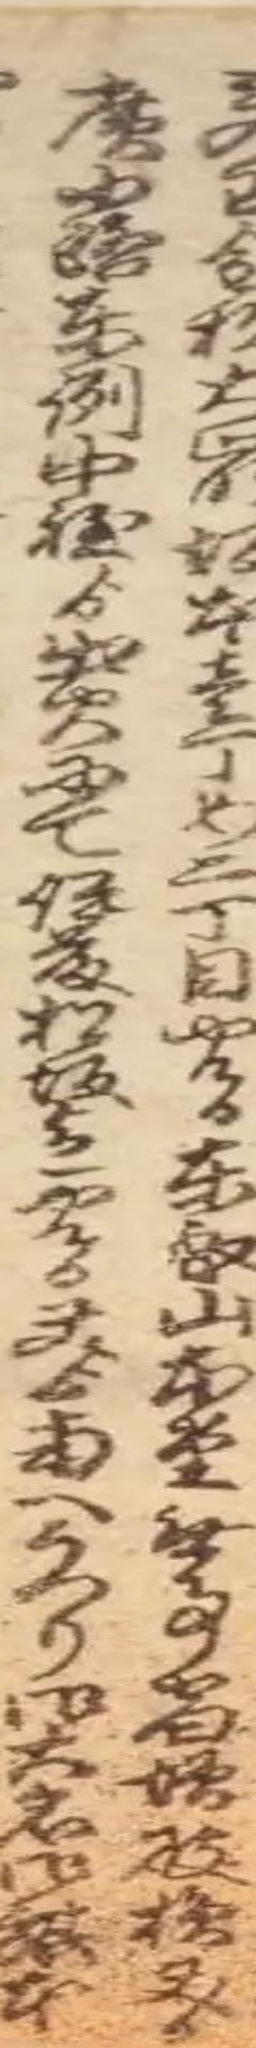広小路東洲中程より出火にて伊藤松坂迄やける夫より南へうつり御大名御旗本
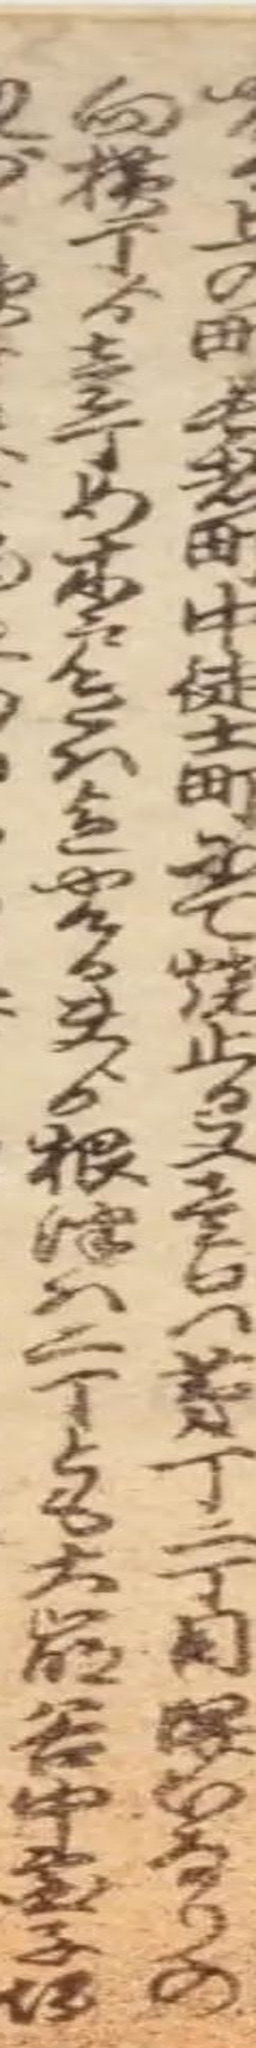向横丁より一丁目木戸きは迄やける夫より根津は二丁とも大崩谷中団子坂
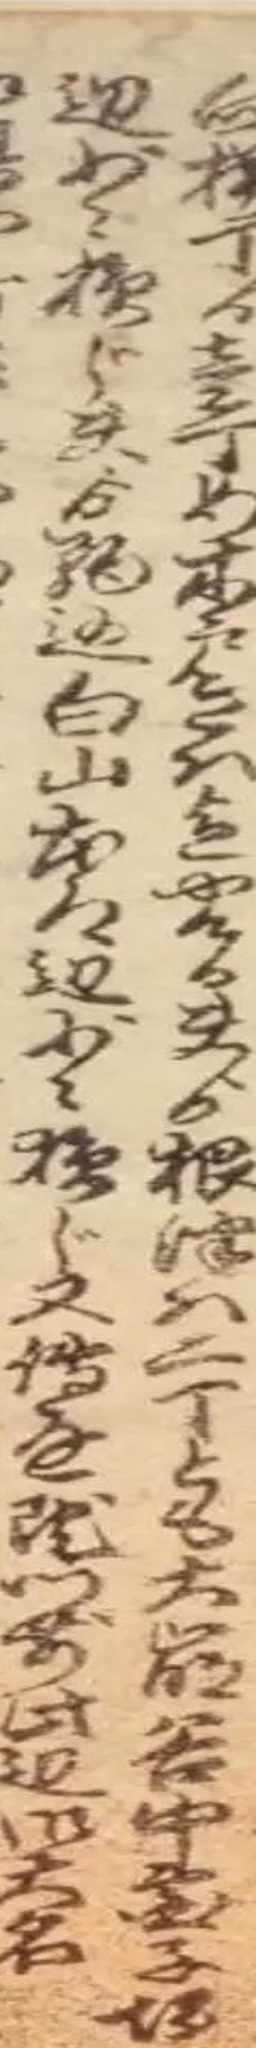辺少〃損じ夫より龍白山本辺少〃損じ又道院門前此辺御大名
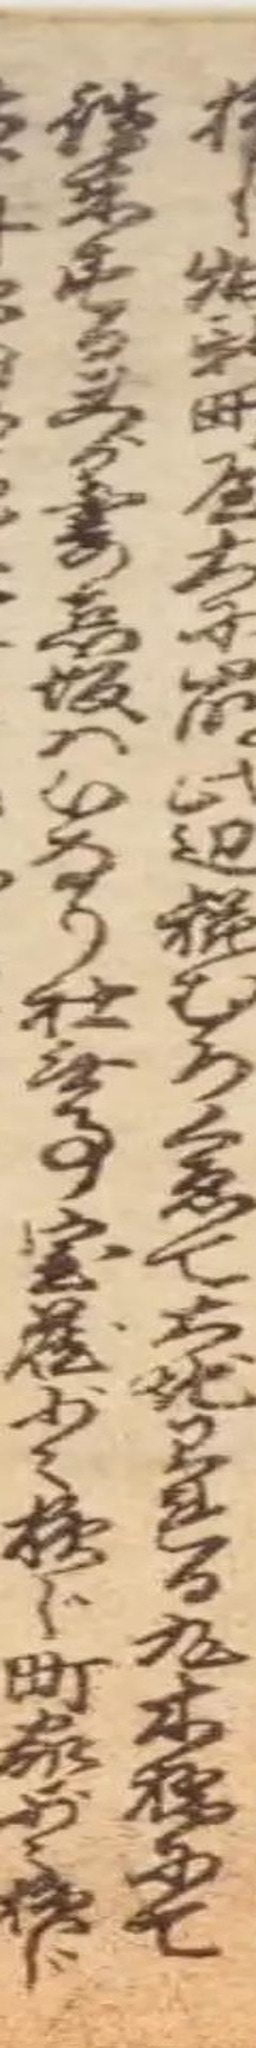往来する夫より妻恋坂はいなり社無事宝蔵少〃損じ町家少〃損じ
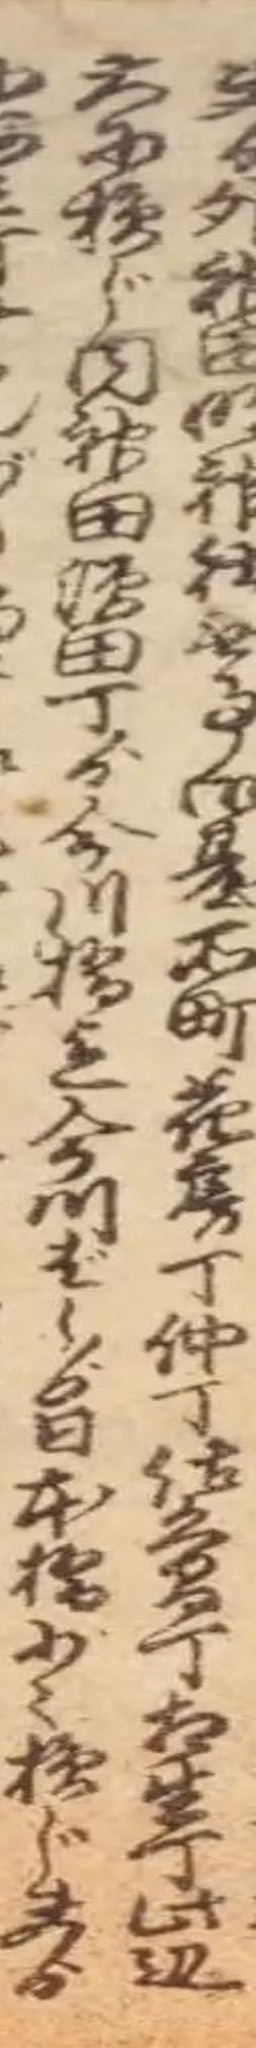大に損じ内神田源田丁より今川橋迄今川橋より日本橋少〃損じ夫より
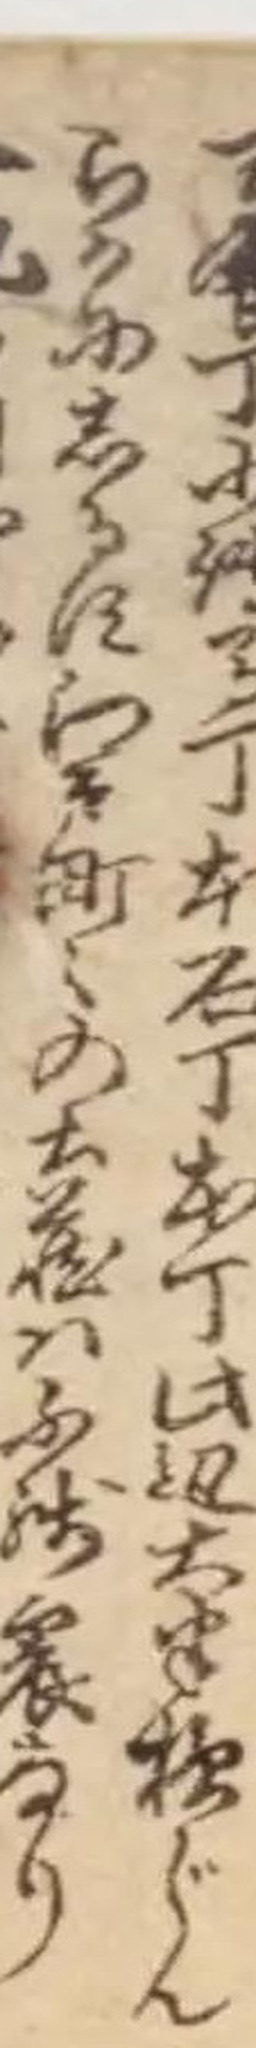らかにしるす町々の土蔵は不残震なり
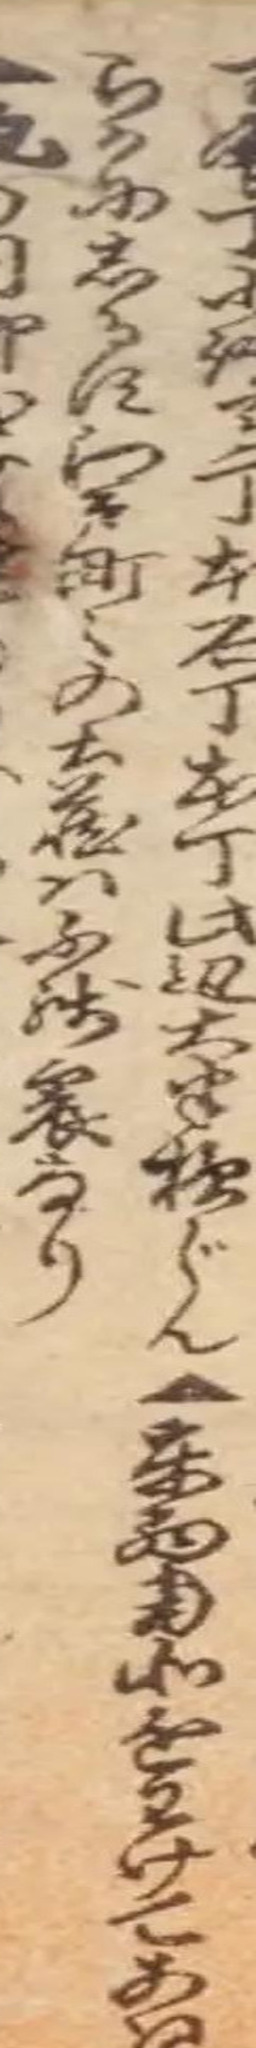らかにしるす町々の土蔵は不残震なり
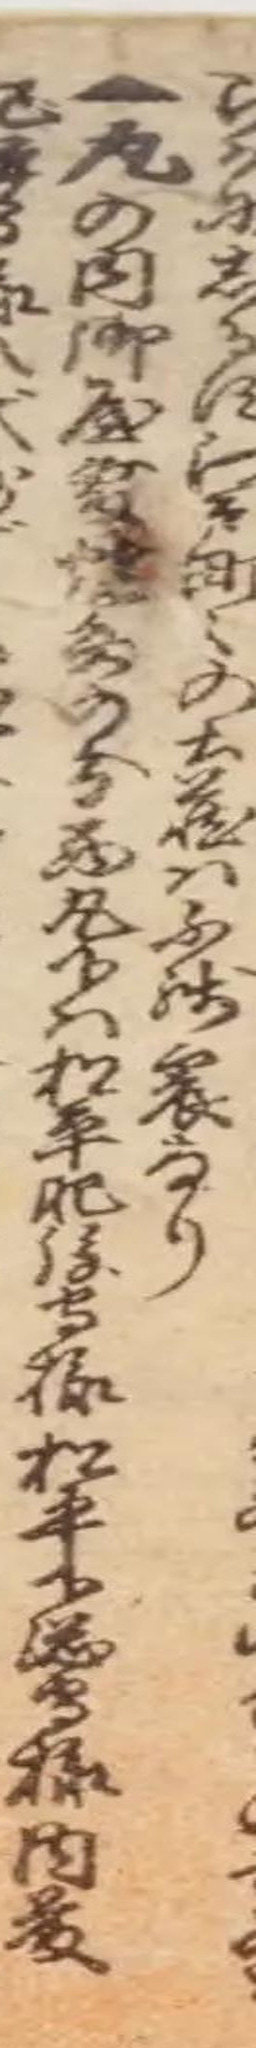▲丸の内御屋敷焼の西丸下は松平肥後守様松平下総守様内藤
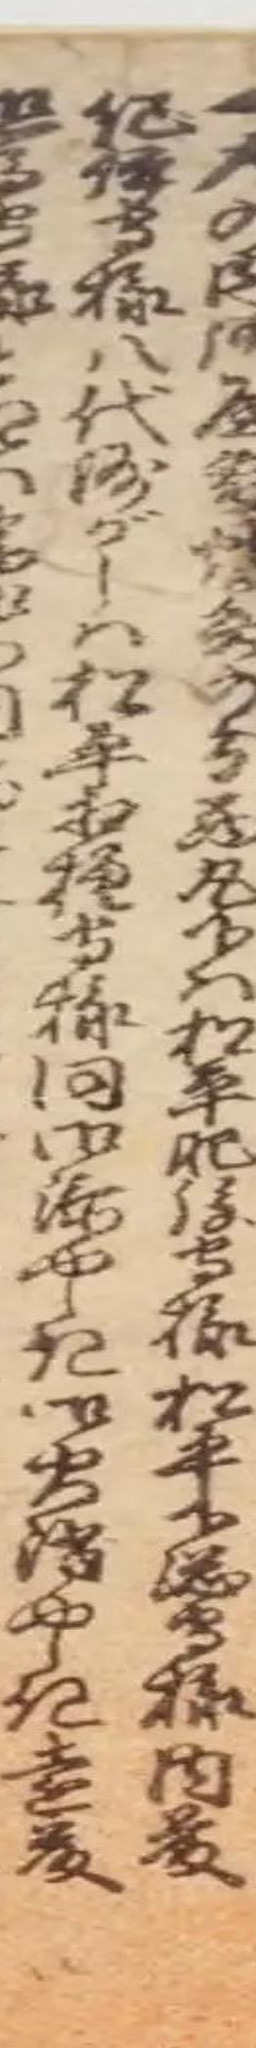紀伊守様八代洲がしは松平相模守様同御やしき御火消やしき遠藤
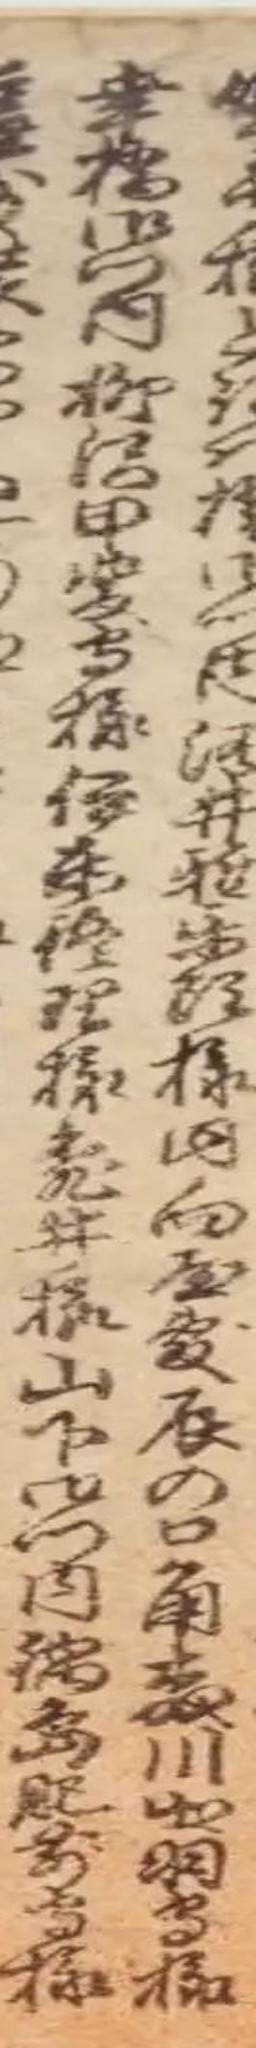幸橋御用門柳沼甲斐守様伊東修理様遠井様山下御用門鍋島肥前守様
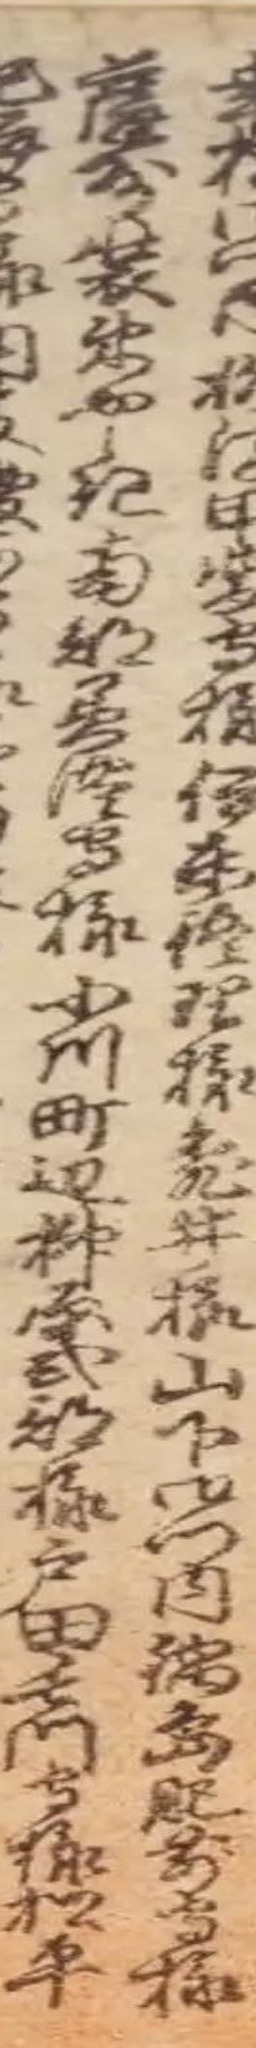く装束やしき南部美濃守様小川町辺柳原式部様戸田長門守様松平
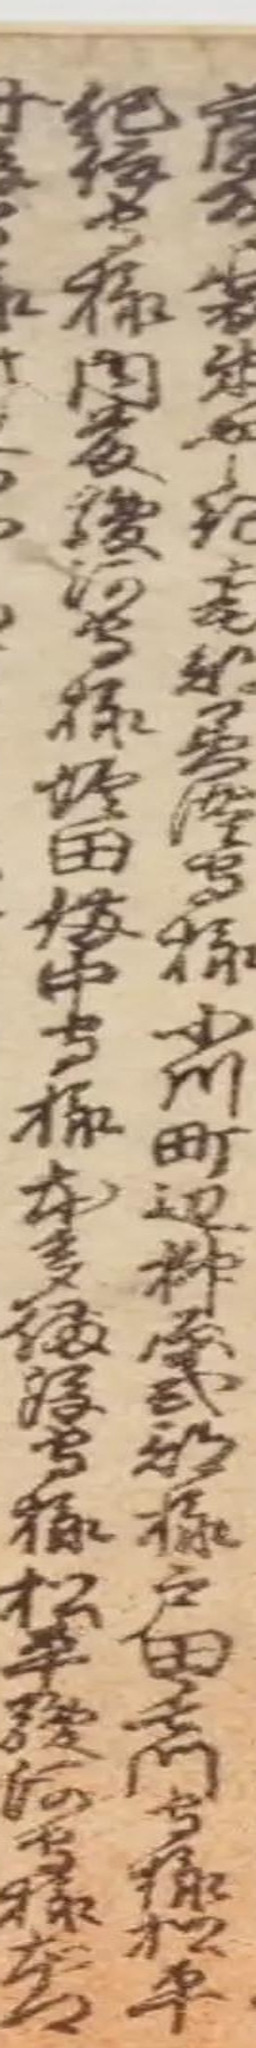紀伊守様内藤駿河守様堀田備中守様本多備後守様松平駿河守様本
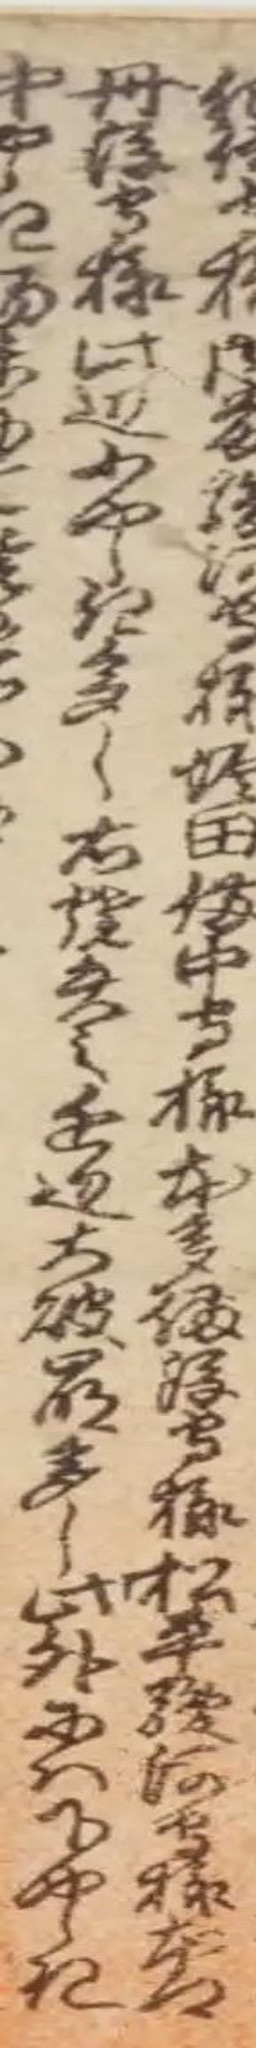丹後守様此辺にやしき多し右消失し近辺大破崩多し此外には下やしき
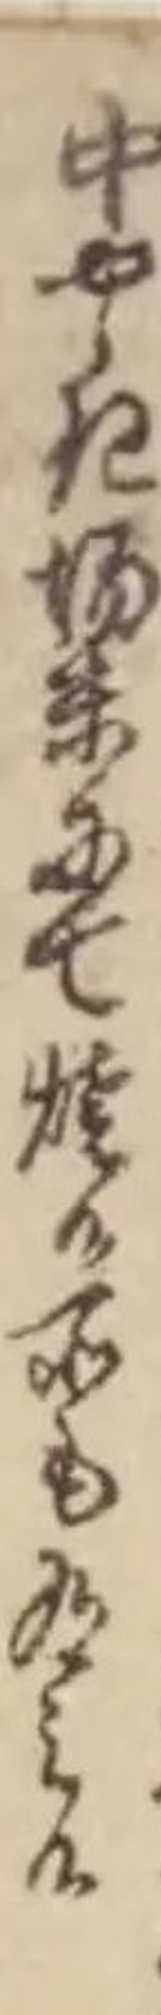中やしき場末にて焼け所もみ
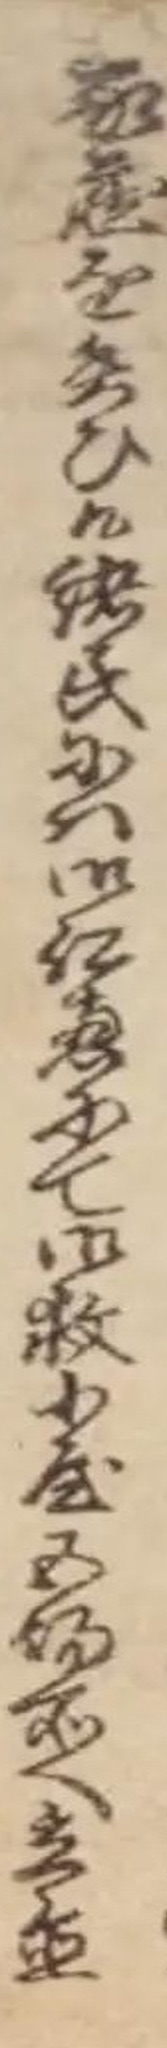家蔵を失ひ諸民には御慈悲にて御救小屋五個所へ立重
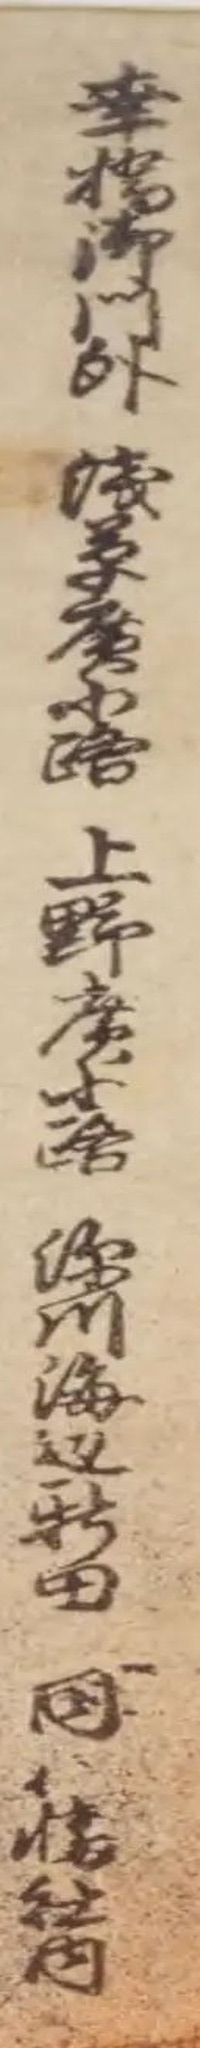幸橋御門外浅草広小路上野広小路深川海辺新田同神社内
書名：（安政二年江戸大地震火事場の図）
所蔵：国立国会図書館 National Diet Library, JAPAN
